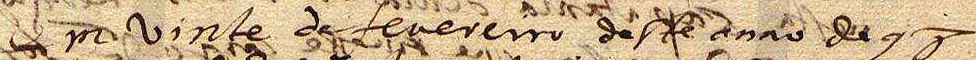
Em vinte de feuereiro deste anno de 98
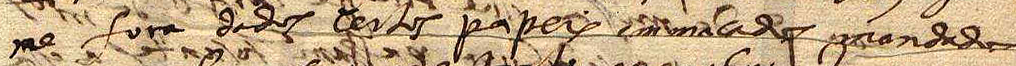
me fora dados certos papeis emmacados mandados
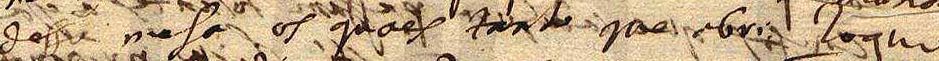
dessa mesa os quaes tanto que abri loguo
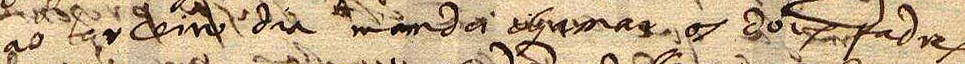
ao terceiro dia mandei chamar os dois padres
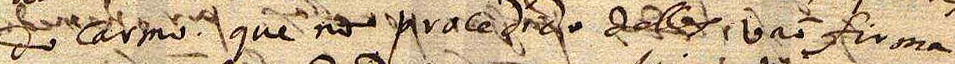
do carmo que no procedido delles vaõ firma
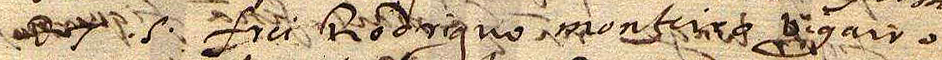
dos .s. frei Rodriguo monteiro vigairo
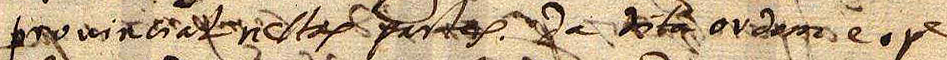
prouinciaL nestas partes. da dita ordem e o pe
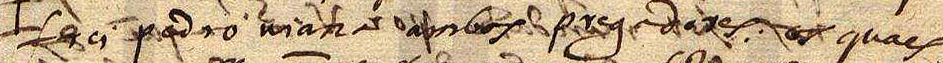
frei pedro uiana ambos pregadores os quaes
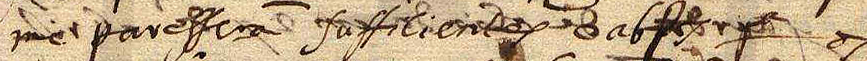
me paresserā sufficientes e abtos ꝑa os
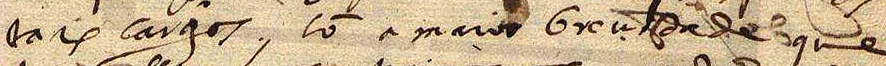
tais cargos . cō a maior breuidade que
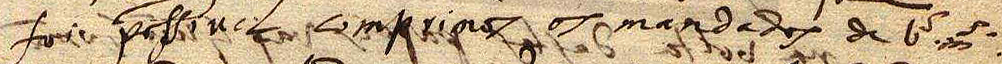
foi possiueL comprimos os mandados de vs. ms.
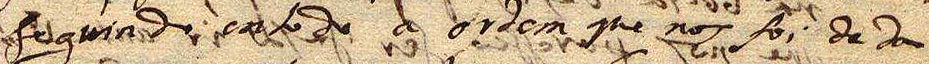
seguindo en todo a ordem que nos foi dada
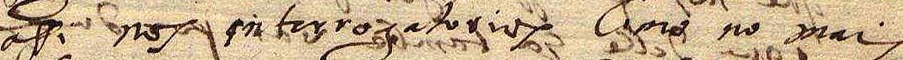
assi nos interrogatorios Como no mais
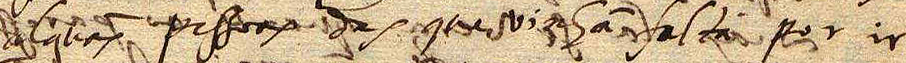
alguas̄ pessoas das que vinhā falta por ir
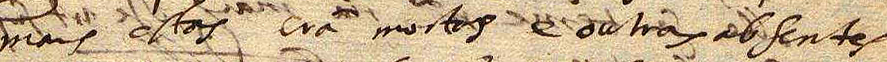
mais estas erā mortas e outras absentes
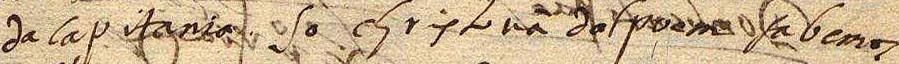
da capitania . so christouā dalpoem sabemos
